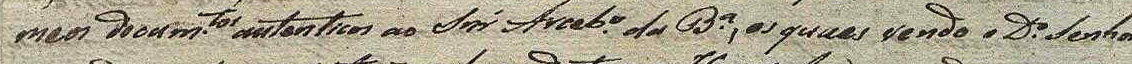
meos docum.tos autenticos ao Snr̄ Arceb.o da B.a, os quaes vendo o D.o Senhor
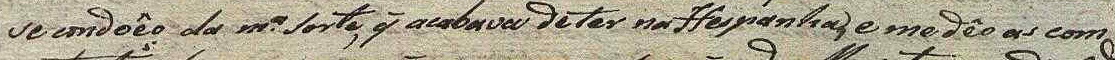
se condoêo da m.a sorte, q̄ acabava de ter na Hespanha, e me dêo as com
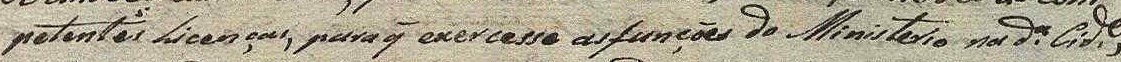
petentes Licenças, para q̄ exercesse as funções do Ministerio na d.a Cid.e,
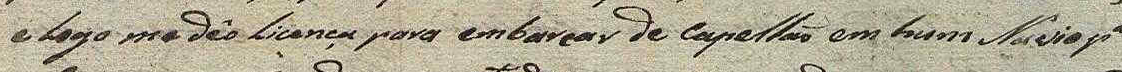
e Logo me déo licença para embarcar de capellaõ em hums Navio p.a
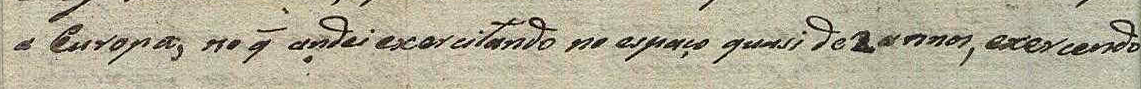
a Europa, no q̄ andei exercitando no espaço quasi de 2 annos, exercendo
